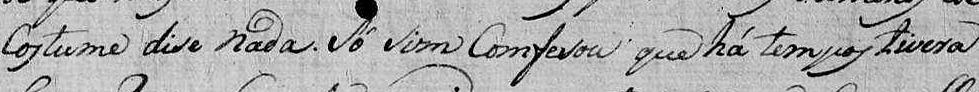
Costume dise nada. só sim Comfesou que há tempos tivera
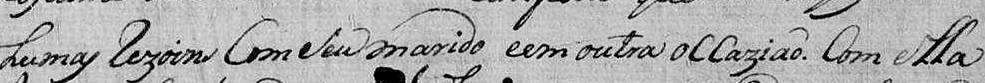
humas Rezoins Com seu marido e em outra oCCaziaõ. Com ella
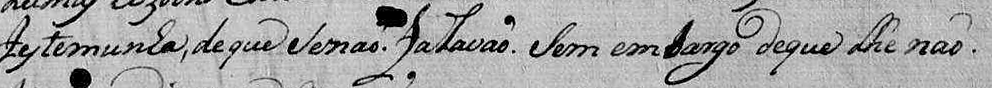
testemunha, de que se naõ. falavaõ; sem embargo de que lhe naõ.
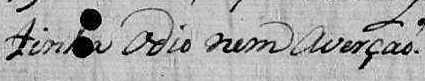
tin_a odio nem Averçaõ.
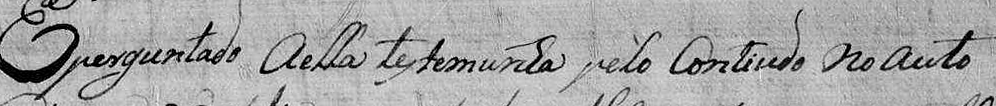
E perguntado A ella testemunha pelo Contiudo no auto
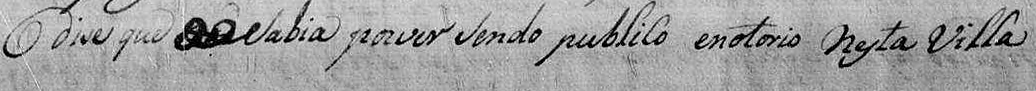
dise quo _ Sabia por ver sendo publico e notorio nesta Villa
